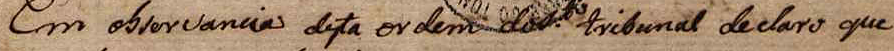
Em observancia desta ordem do Sto tribunal declaro que
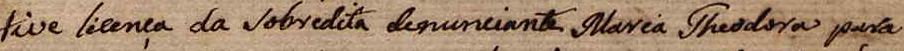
tive licença da sobredita denunciante Maria Theodora para
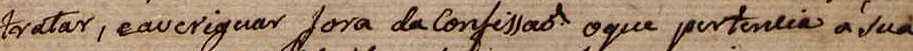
tratar, e averiguar fora da confissaõ o que pertencia á sua
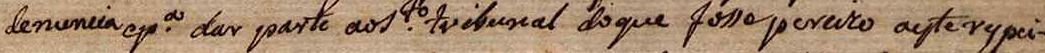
denuncia e p.a dar parte ao Sto tribunal do que fosse percizo a este respei
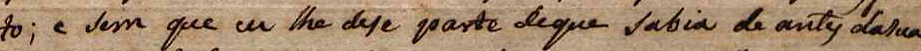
to; e sem que eu lhe dese parte de que sabia de antes da sua
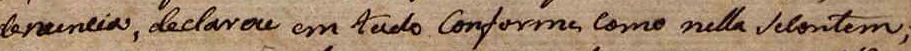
denuncia, declarou em tudo conforme como nella se contem;
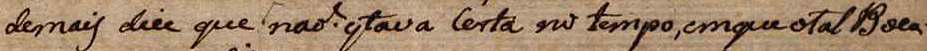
demais dice que naõ estava certa no tempo, em que o tal Boca
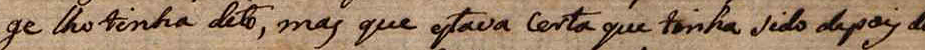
ge lho tinha dito, mas que estava certa que tinha sido depois da
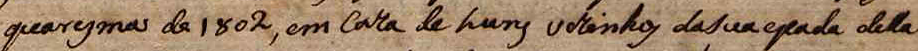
quaresma de 1802, em caza de huns vezinhos da sua escada della
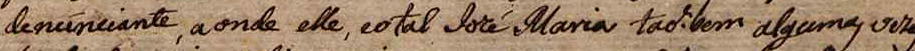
denunciante, aonde elle, e o tal Jozé Maria taõbem algumas vezes
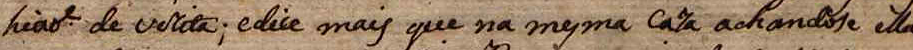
hiaõ de vizita; e dice mais que na mesma caza, achandose ella
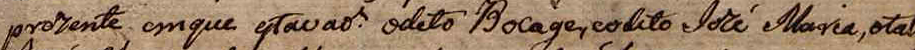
prezente em que estavaõ o dito Bocage, e o dito Jozé Maria, o tal
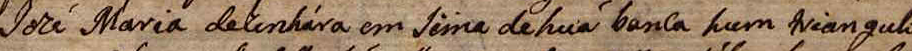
Jozé Maria dezenhára em sima de huā banca hum triangulo
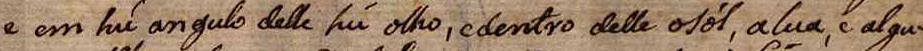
e em hū angulo delle hū olho, e dentro delle o sól, a lua, e algu
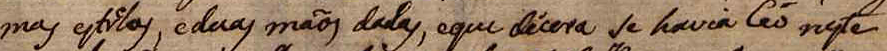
mas estrelas, e duas mãos dadas, e que dicera, se havia Céo neste
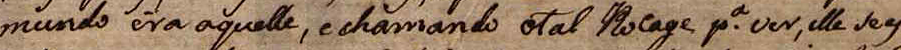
mundo éra aquelle, e chamando o tal Bocage p.a ver, elle se es
